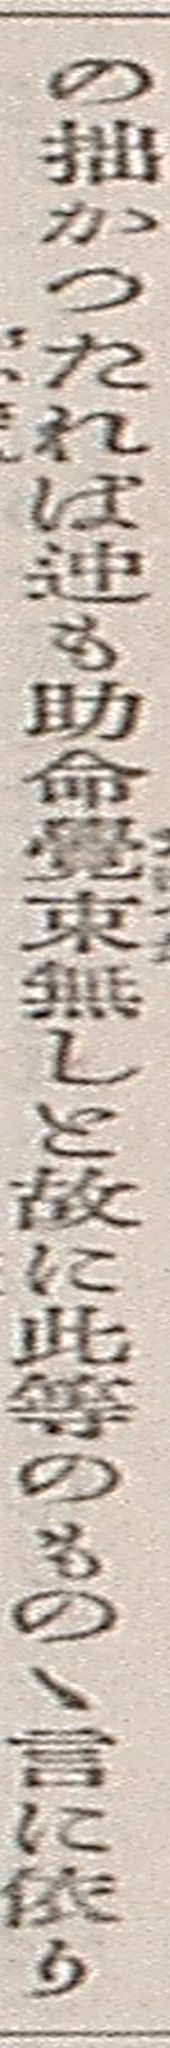の拙かつたれば迚も助命覚束無しと故に此等のものゝ言に依り
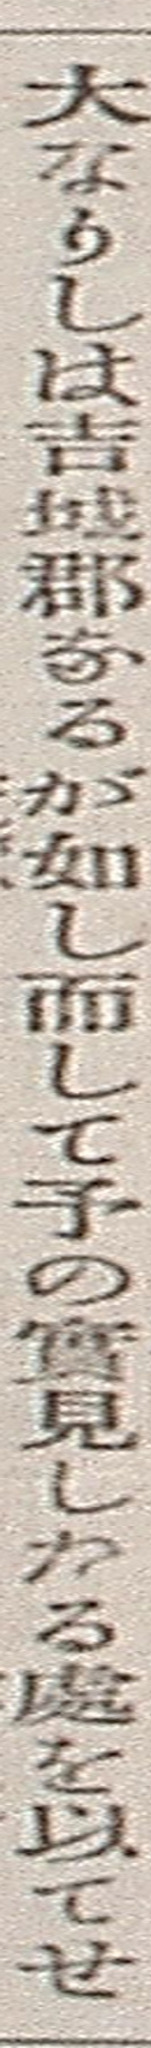大なりしは吉城郡なるが如し而して予の実見したり処を以てせば
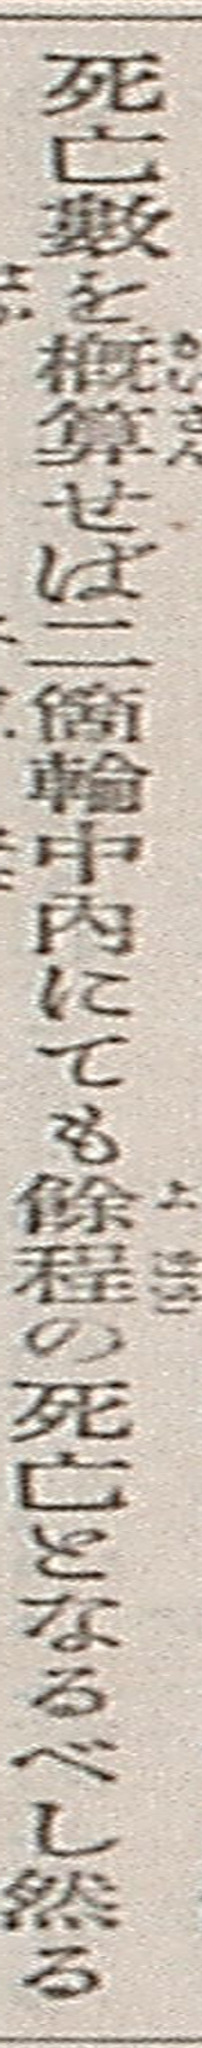死亡数を概算せば二箇輪中にても餘程の死亡となるべし然る
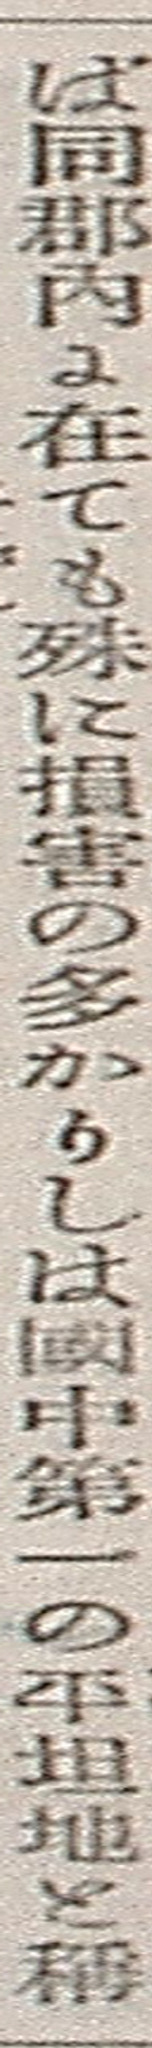同郡内に在ても殊に損害の多かりしは国中第一の平坦地と称
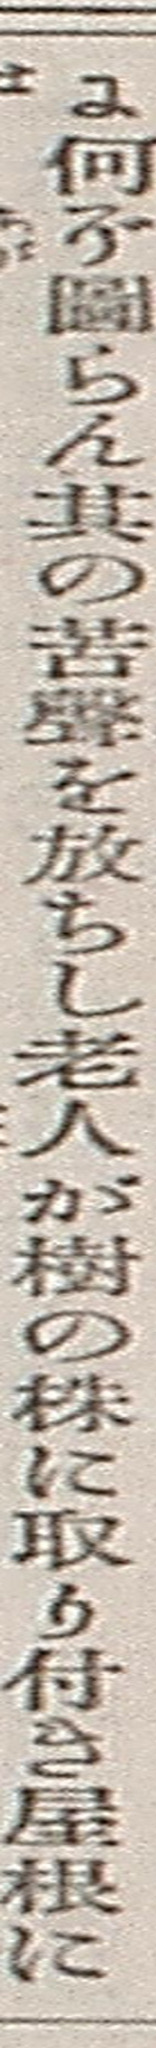に何ぞ圖らん其の苦声を放ちし老人が樹の株に取り付き家根に
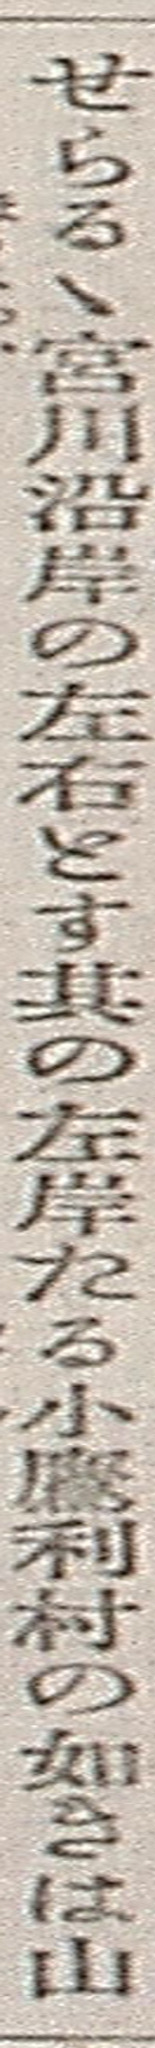せらるゝ宮川沿岸の左右とす其の左岸たる小鷹利村の如きは山
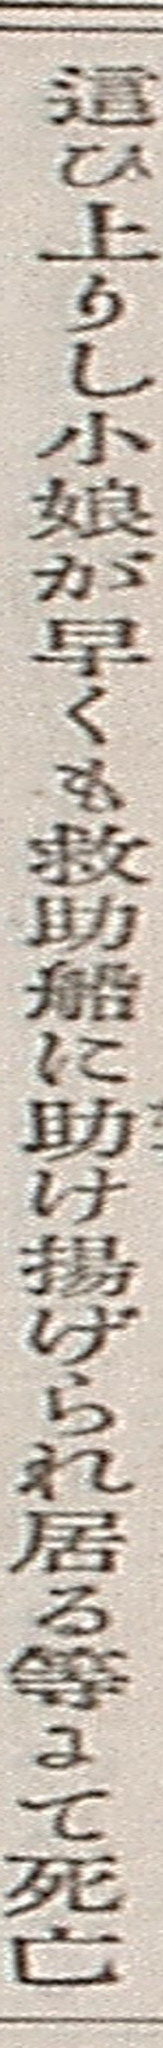這ひ上りし小娘が早くも救助船に助け揚げられ居る等にて死亡
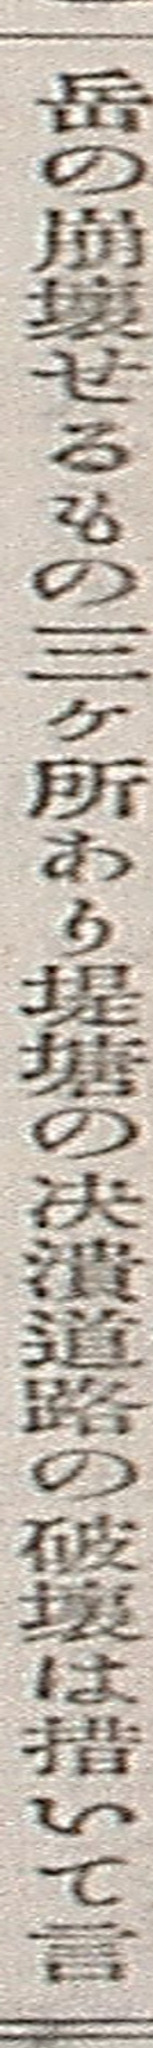岳の崩壊せるもの三ヶ所あり堤塘の决潰道路の破壊は措いて言

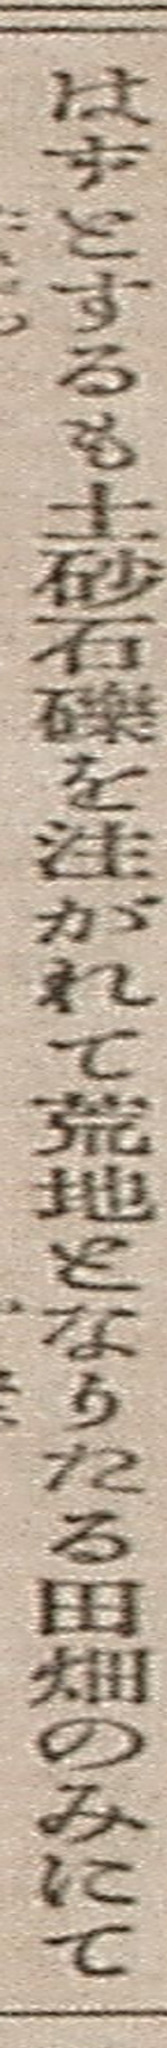はずとするも土砂石礫を注がれて荒地となりたる田畑のみにて
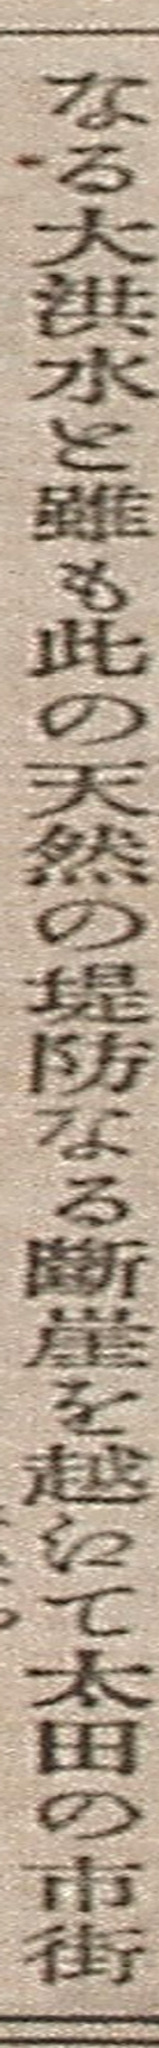なる大洪水と雖も此の天然の堤防なる断崖を越江て太田の市街
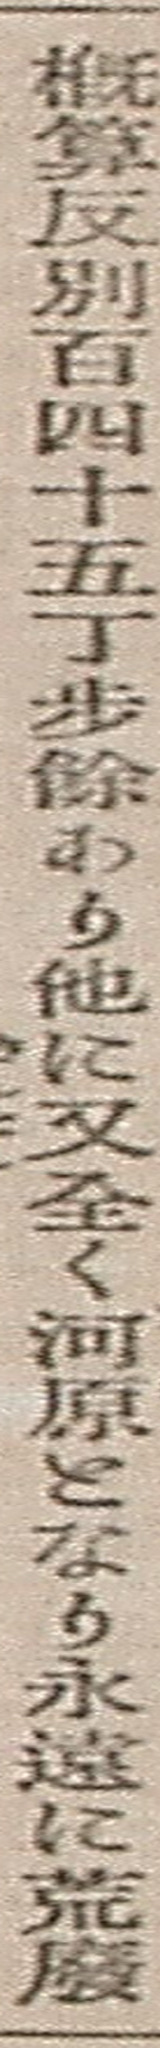概算反別百四十五町歩餘あり他に又全く河原となり永遠に荒廃
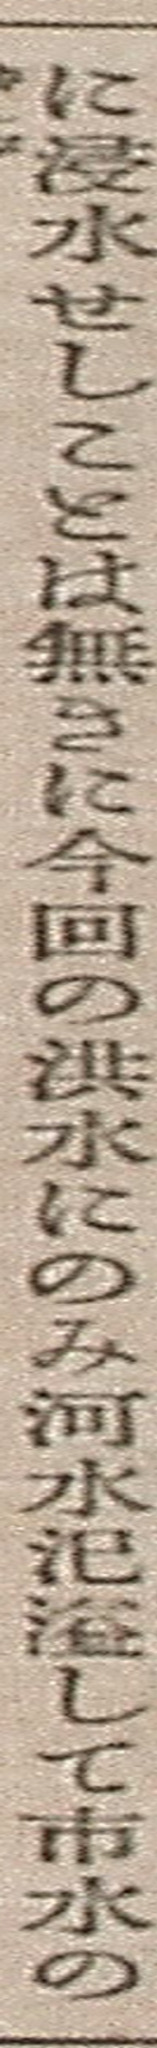に浸水せしことは無きに今回の洪水にのみ河水氾溢して市水の
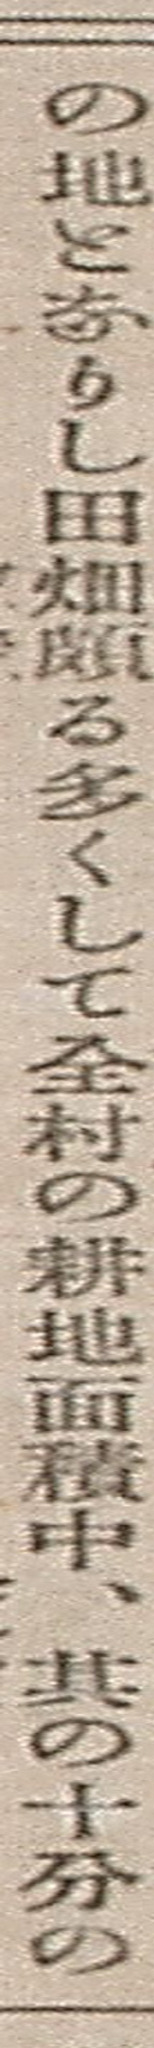の地となりし田畑頗る多くして全村の耕地面積中、其の十分に
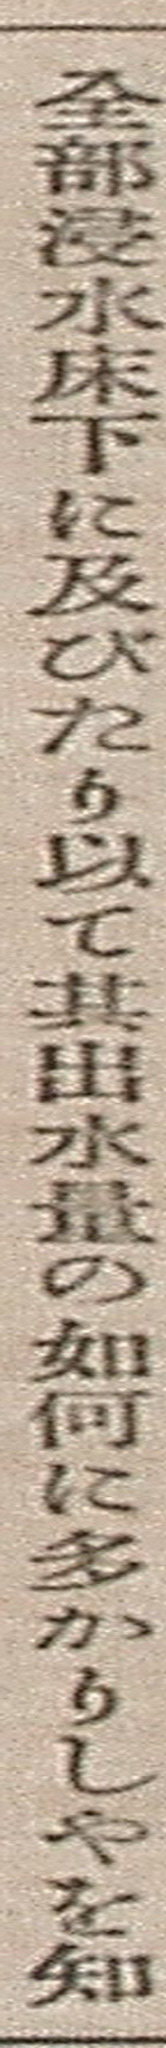全部浸水床下に及びたり以て其出水量の如何に多かりしやを知
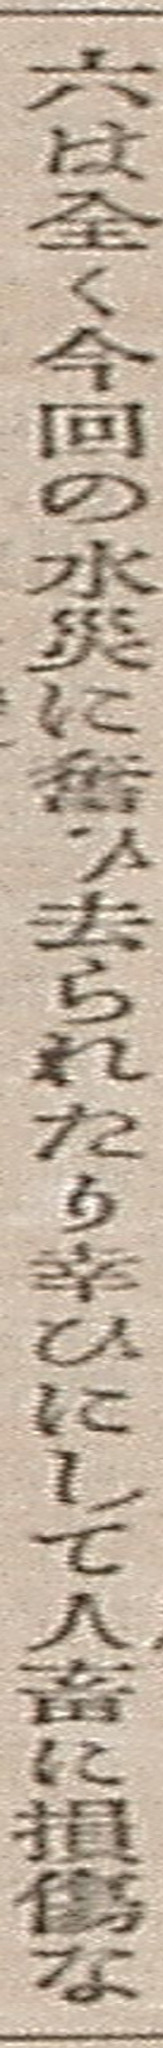六は全く今回の水災に奪ひ去られたり幸ひにして人畜に損傷な
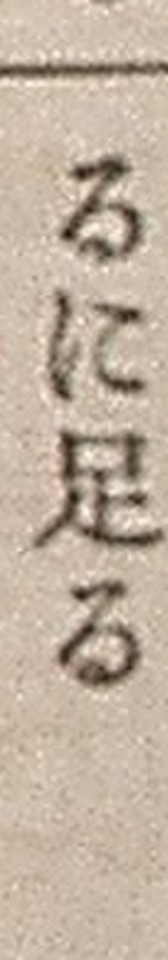るに足る
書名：風俗畫報臨時増刊第百二十六號　洪水被害録（中）
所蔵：東京大学地震研究所図書室 Earthquake Research Institute Library, The University of Tokyo, JAPAN
